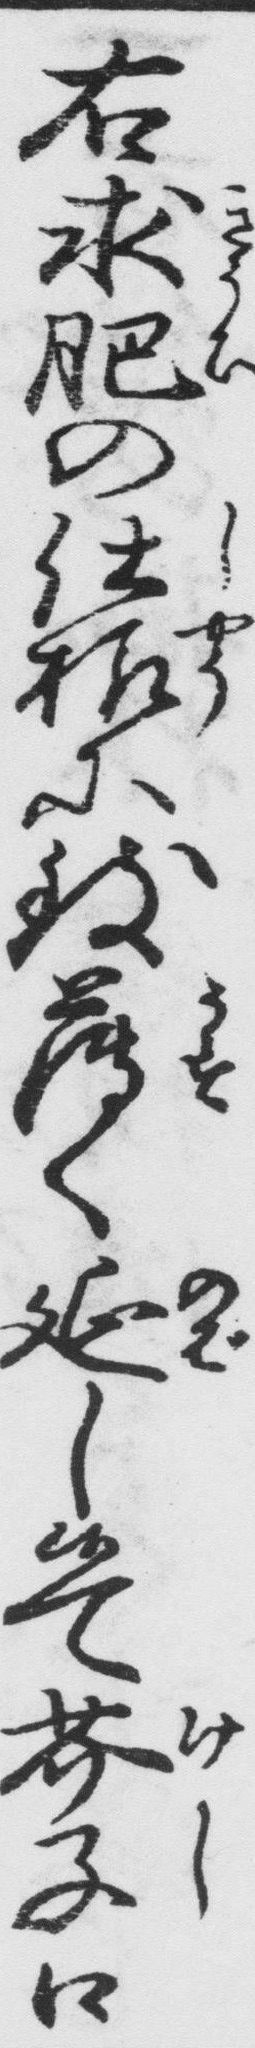右求肥の仕様に致薄く延し候て芥子口
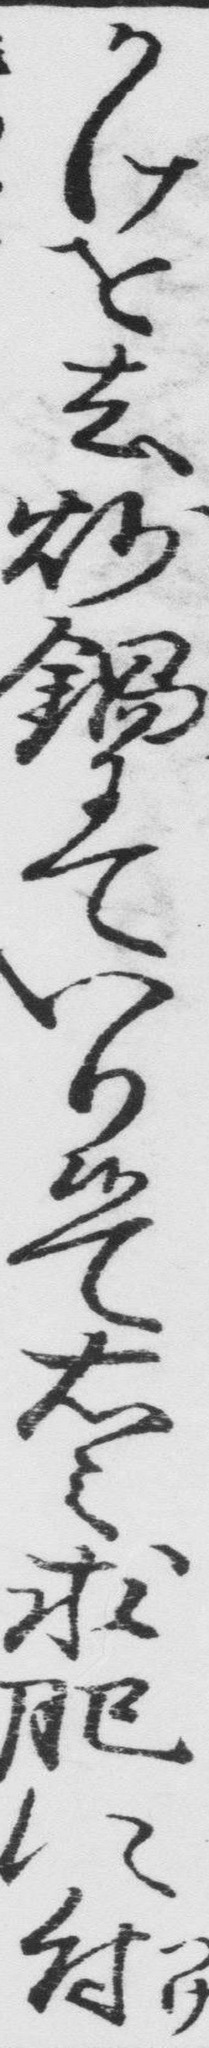かけを去炒鍋にていり候て右之求肥に付
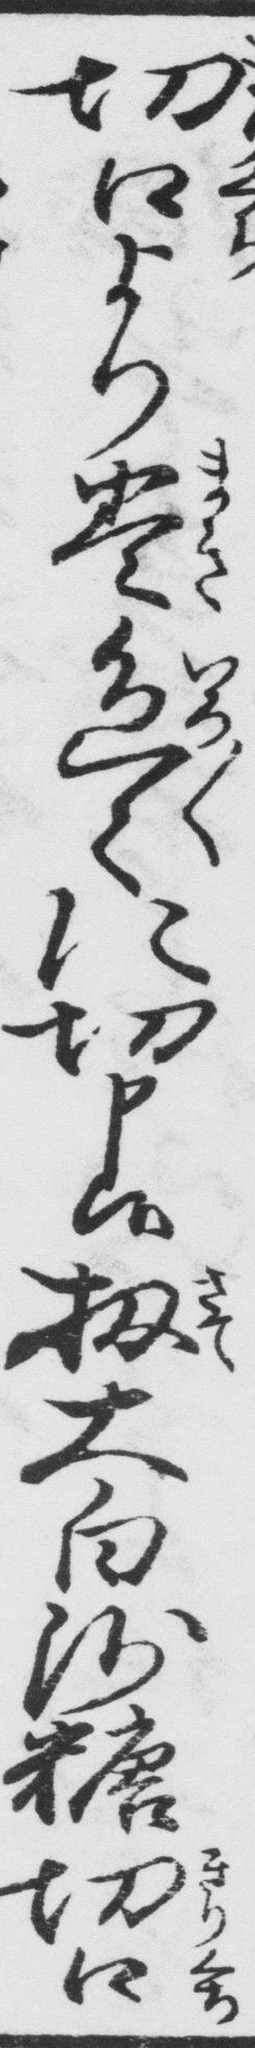切口より巻色々に切申候扨大白沙糖切口
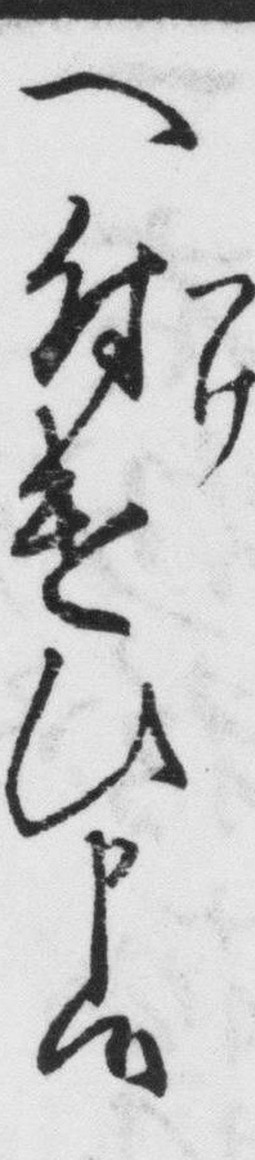へ付遣ひ申候
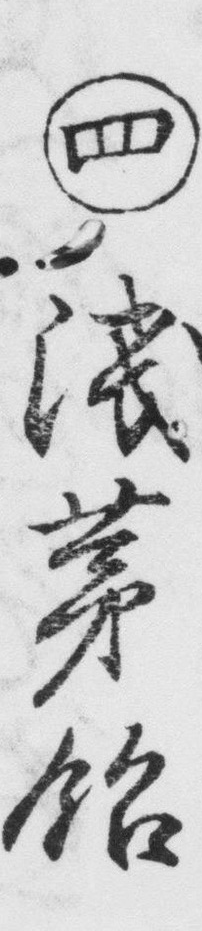(四)浅茅飴
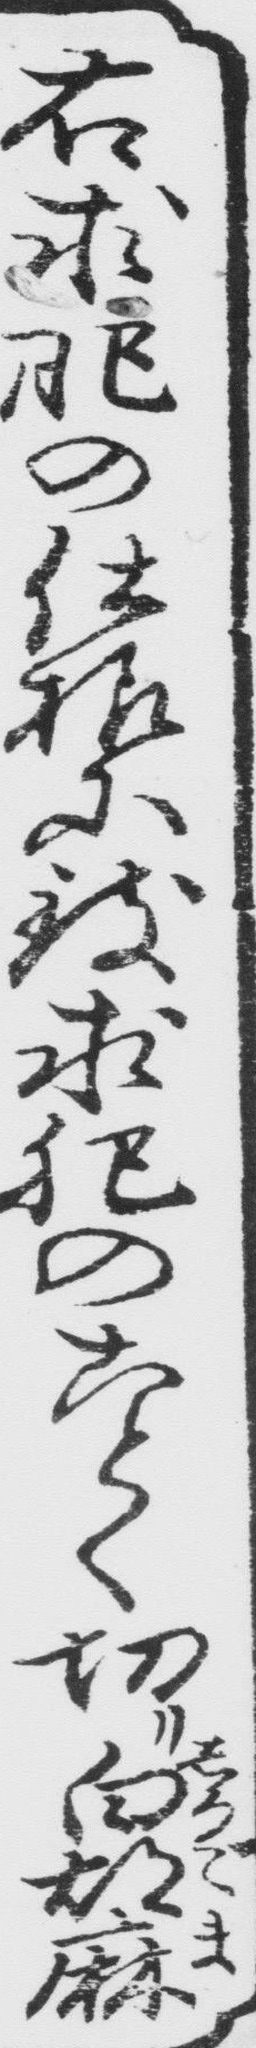右求肥の仕様に致求肥のことく切り白胡麻
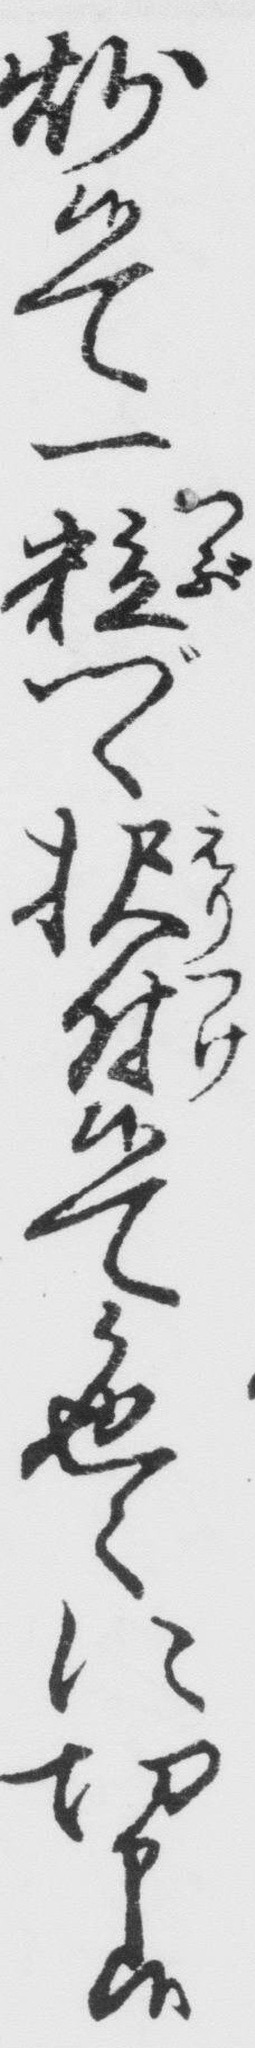炒候て一粒づゝ択付候て色々に切申候
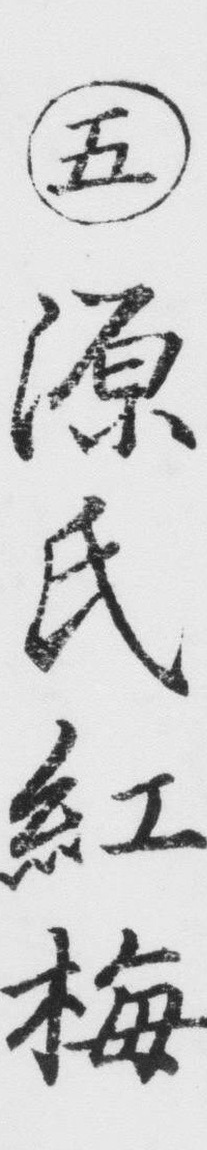(五)源氏紅梅
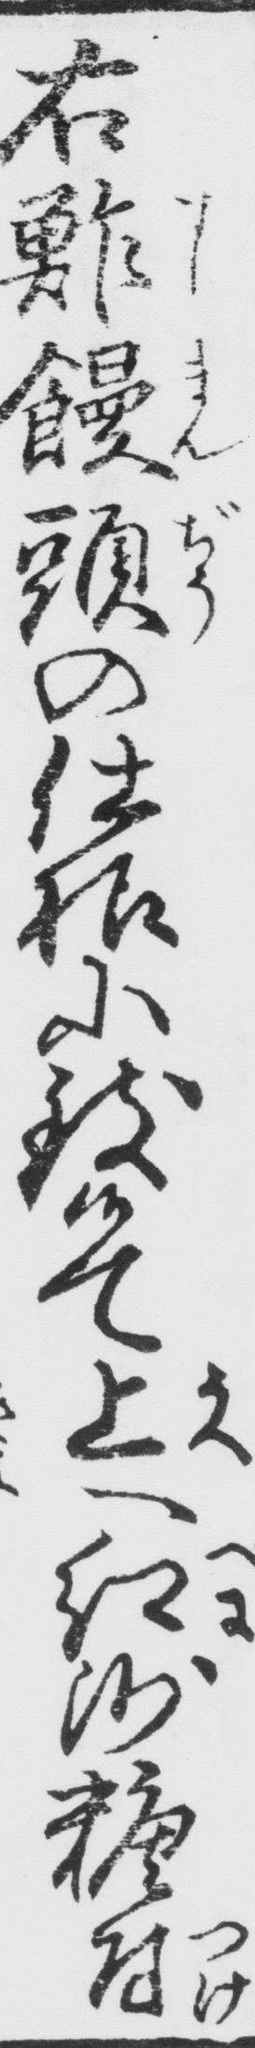右鮓饅頭の仕様に致候て上へ紅沙糖付
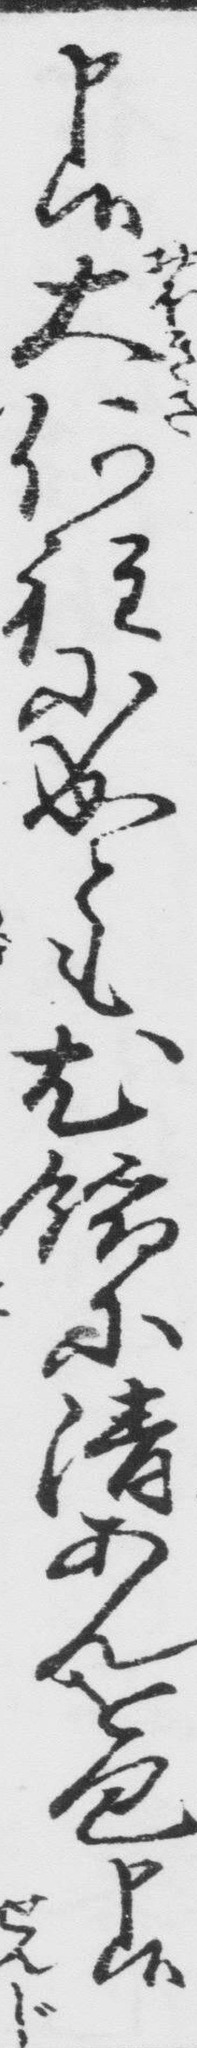申候大何程に成とも尤餡に清あんを包申候
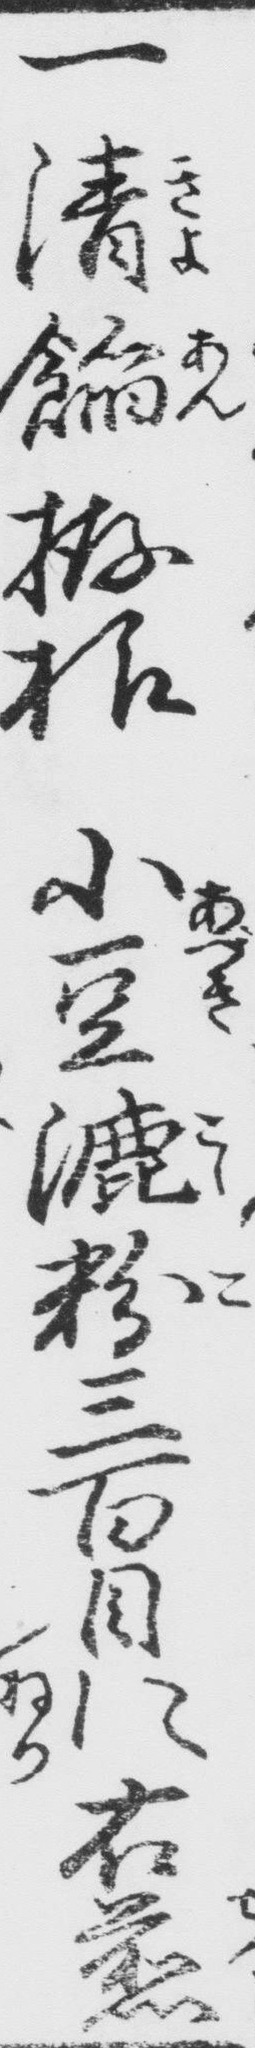一清餡拵様小豆漉粉三百目に右煎
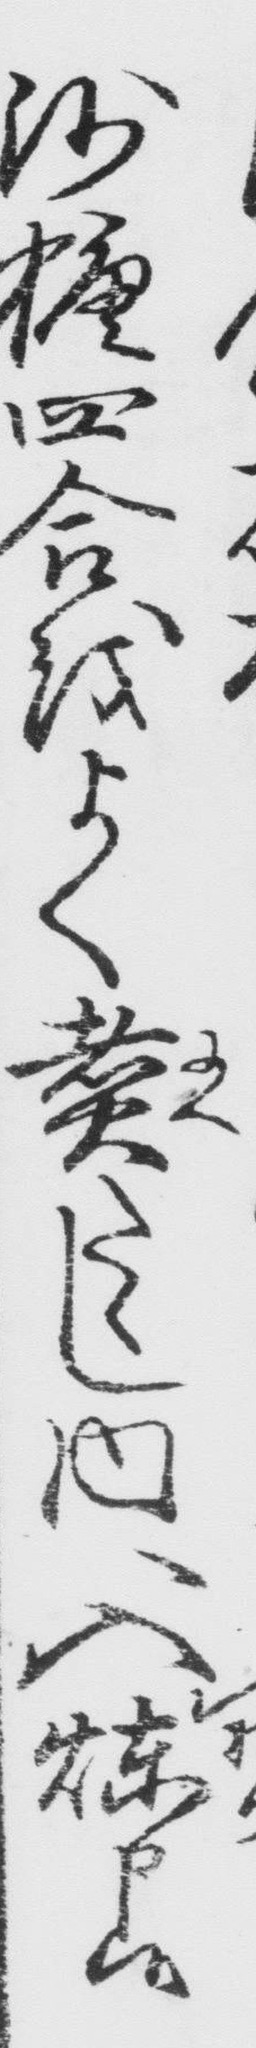沙糖四合をよく煮たゝし内へ入れ煉申候

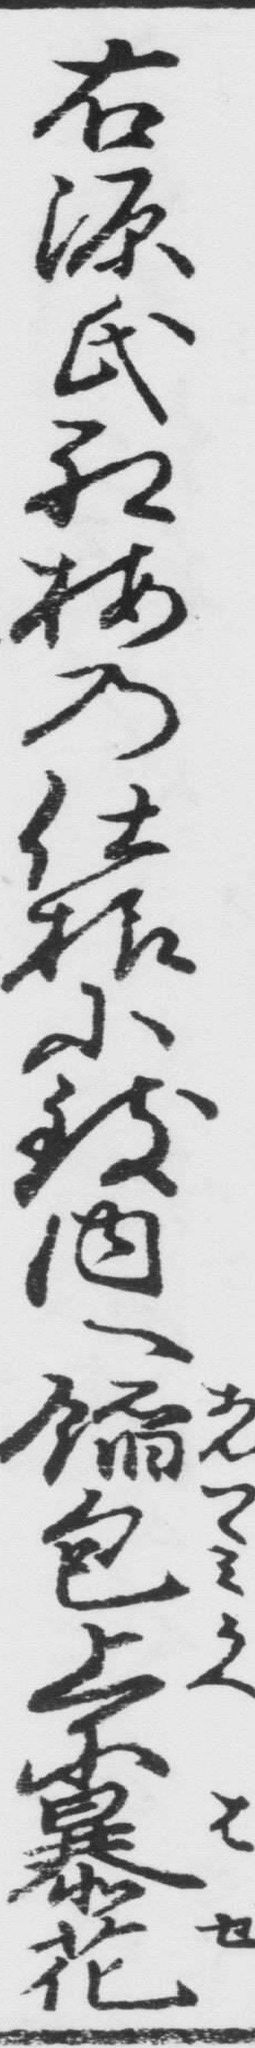右源氏紅梅の仕様に致内へ餡包上に暴花
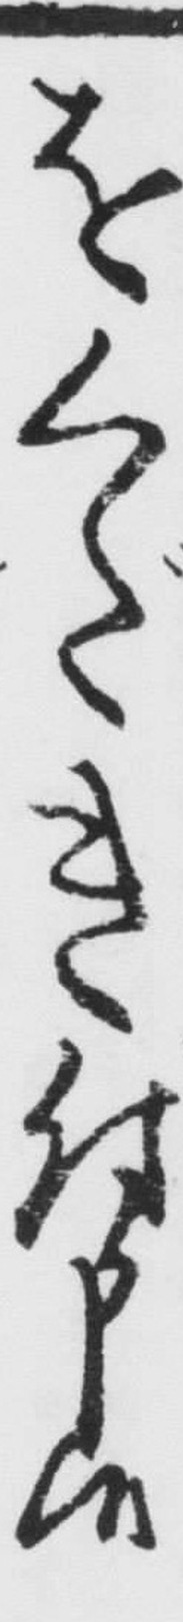をくだき付申候
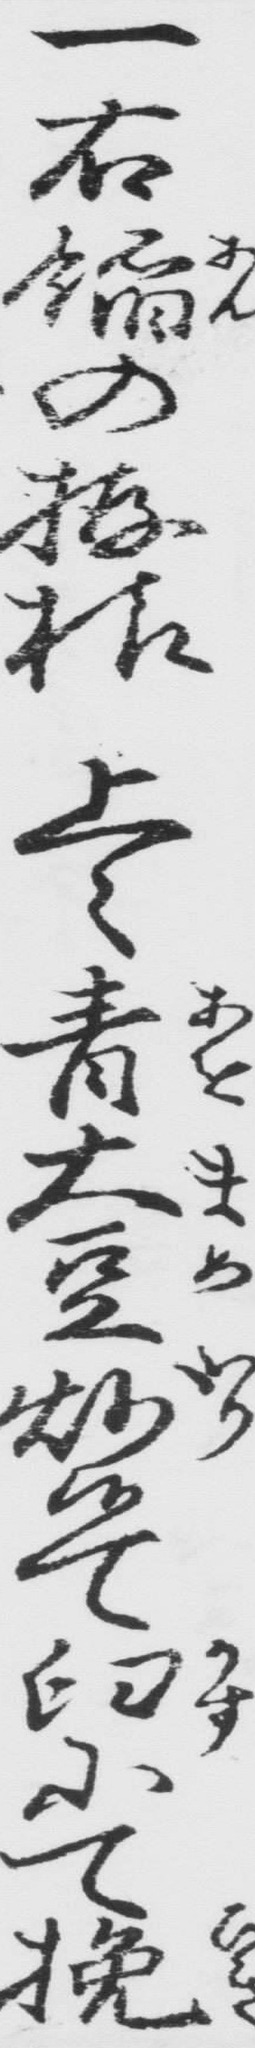一右餡の拵様上々青大豆炒候て臼にて挽
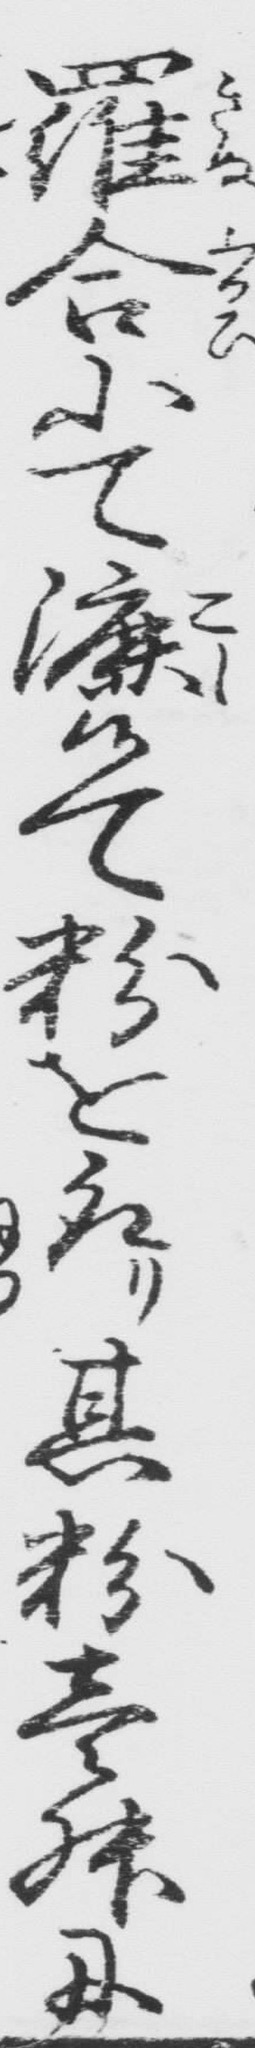羅合に漉候て粉を取り其粉壱升に
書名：御前菓子図式
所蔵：大阪府立大学学術情報センター 国文学研究資料館
